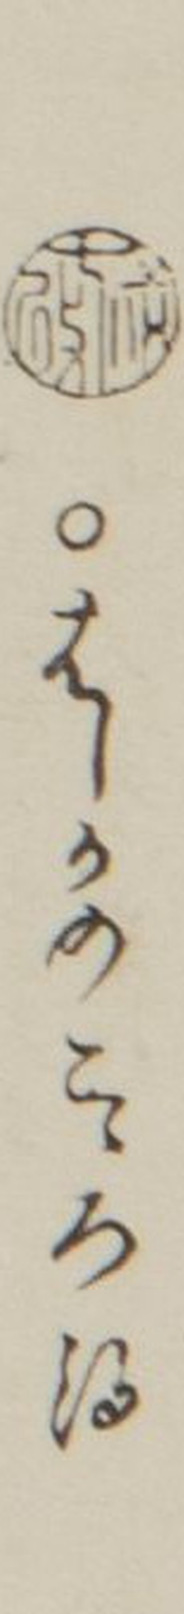○はしかのこゝろ得
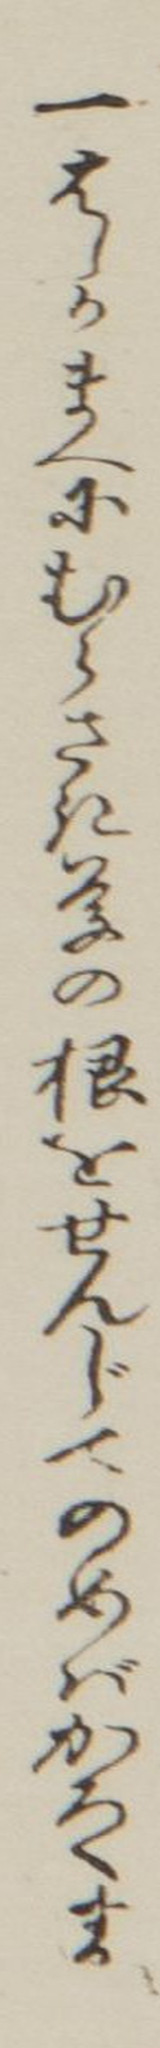一はしかまへにむらさき草の根せんじてのめばかるくする
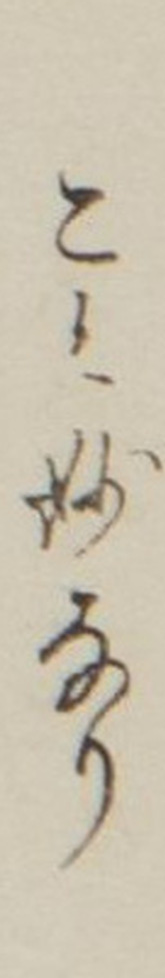こと妙なり
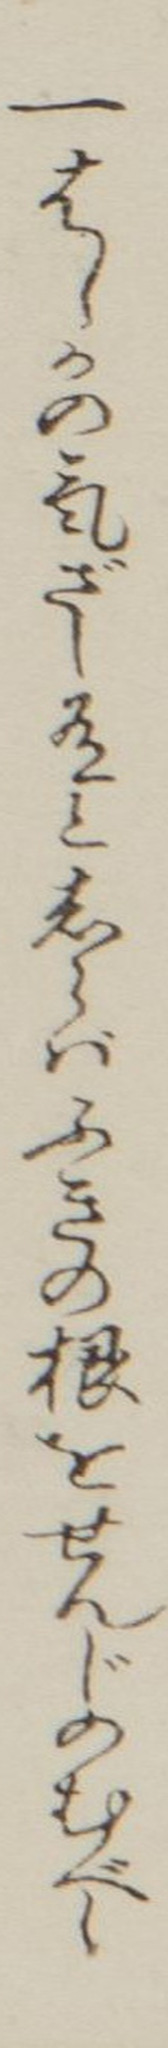一はしかの気ざし有としらばふきの根をせんじのむべし
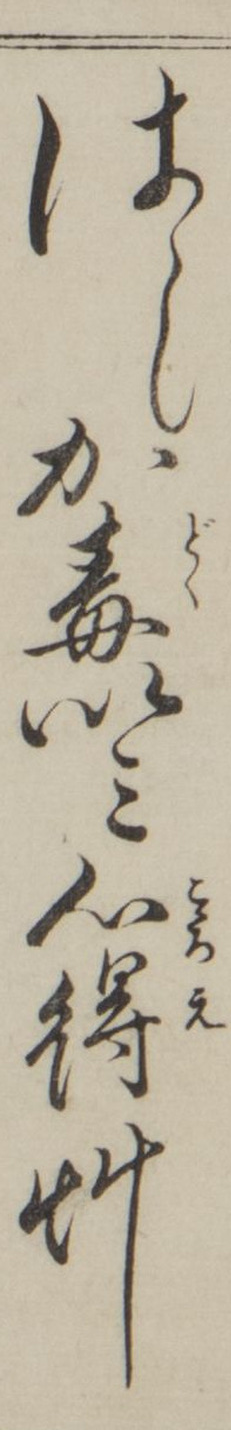はしか毒いみ心得艸
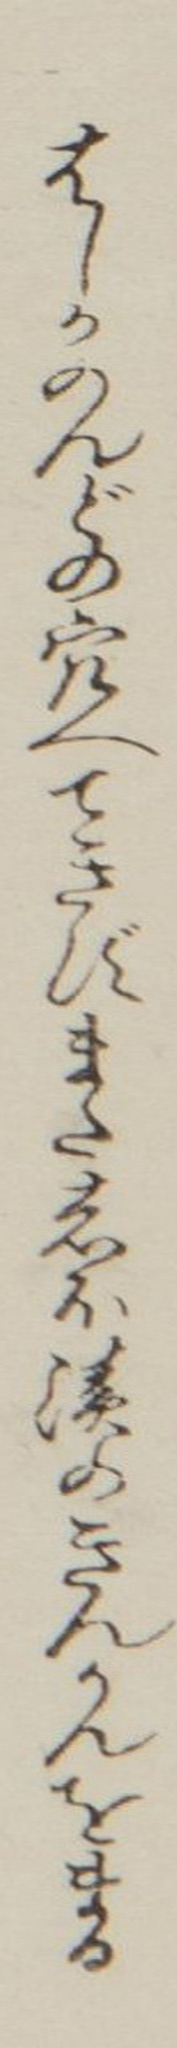はしかのんどの穴へてきずまたしほ漬のきんかんをまる
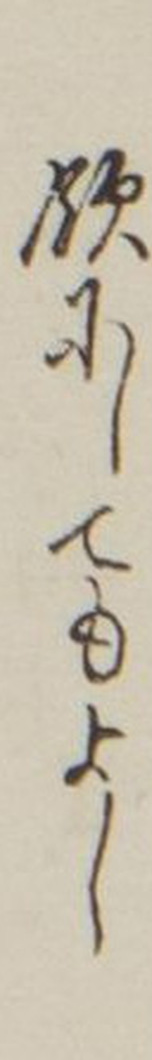飲にしてもよし
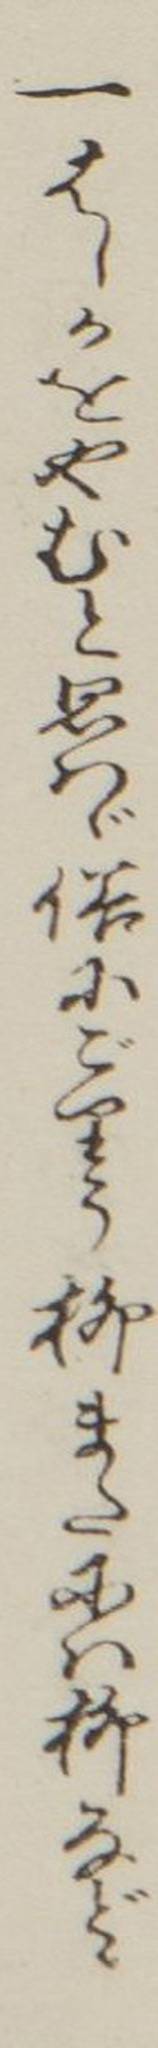一はしかをやむと思はヾ俗にごりう柳またには柳などゝ
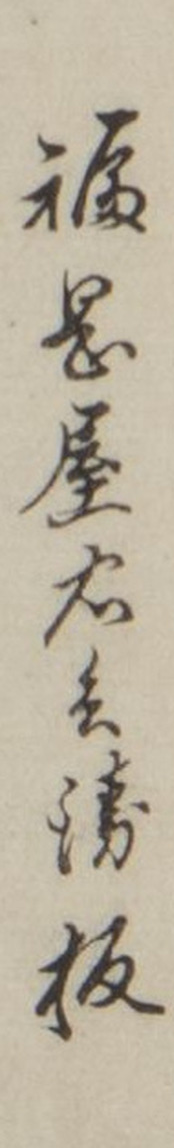福岡屋右兵衛板
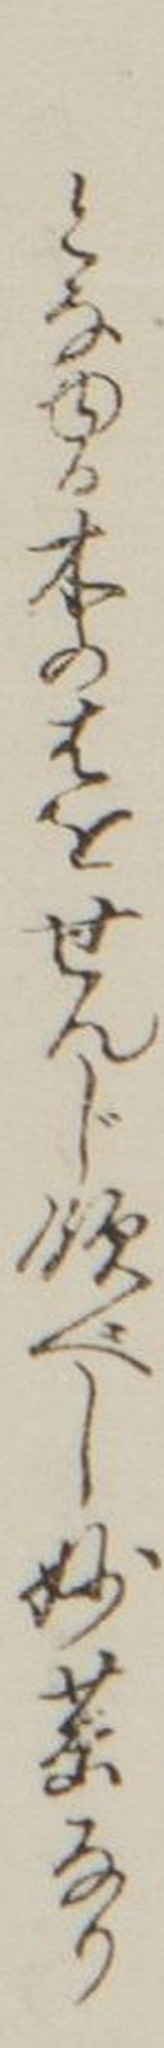となゆる木のはをせんじ飲べし妙薬なり
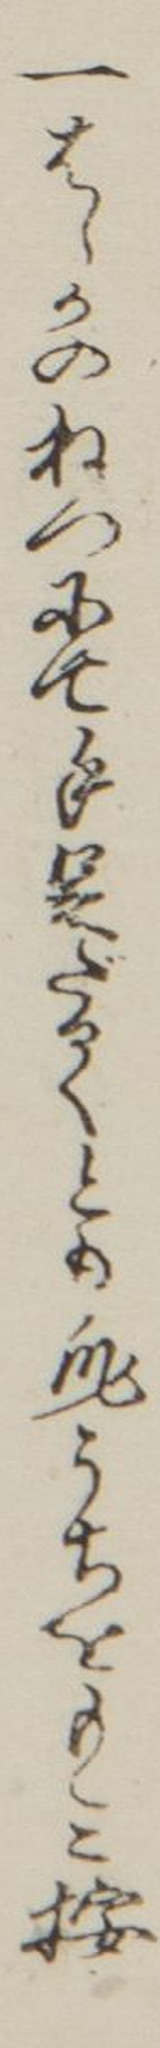一はしかのねつにて手足だるくとも身うちをもみ按
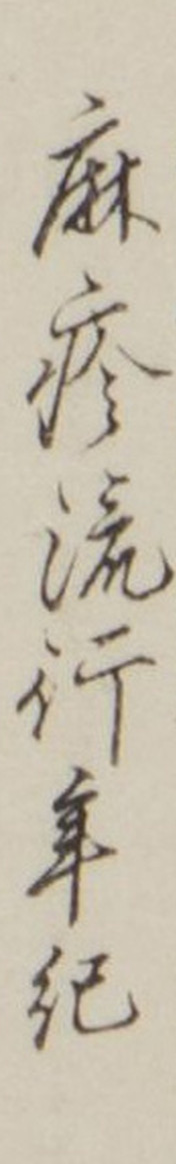麻疹流行年紀
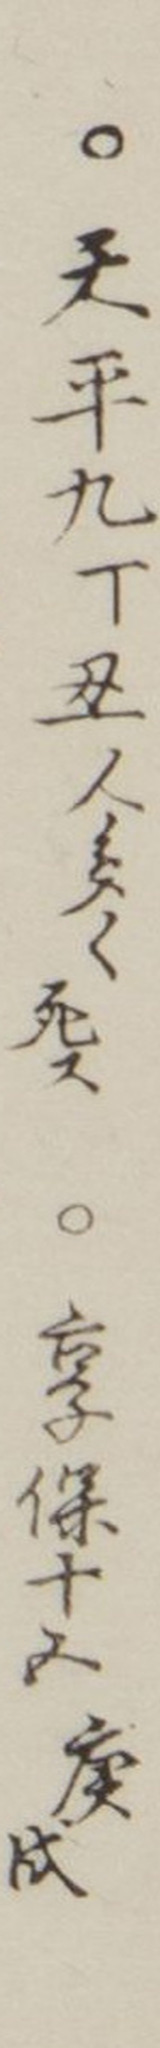○天平九丁丑人多く死す○享保十五庚戌
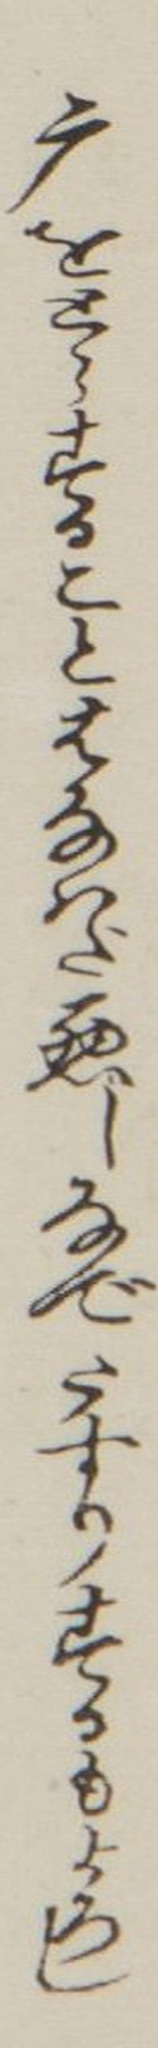摩をとらすることはなはだ悪しなでこすりするもよろし
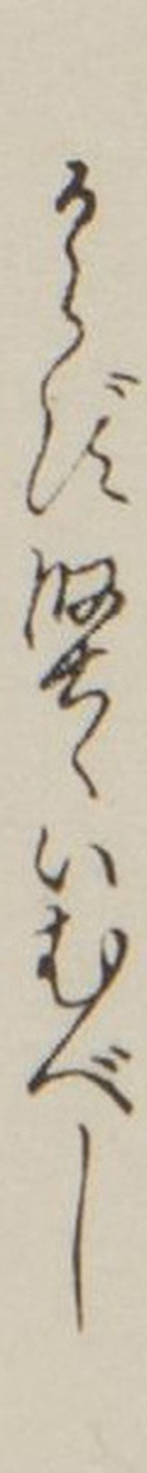からず堅くいむべし
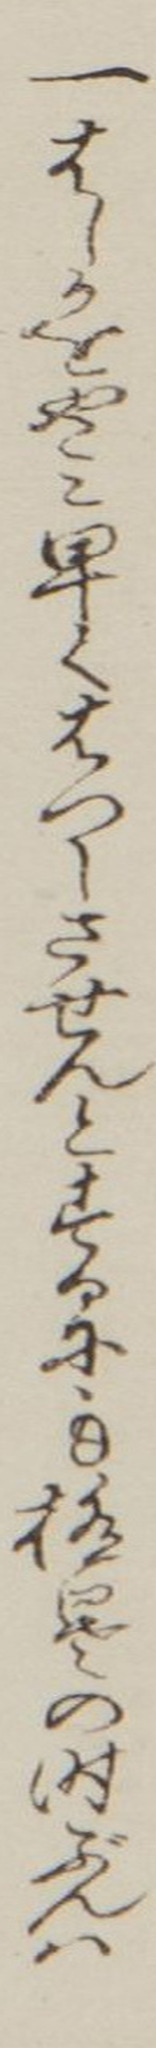一はしかをやみ早くはつしさせんとするにも極寒の時ぶんは
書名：はしか毒いみ心得艸
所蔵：あいおいニッセイ同和損保株式会社
